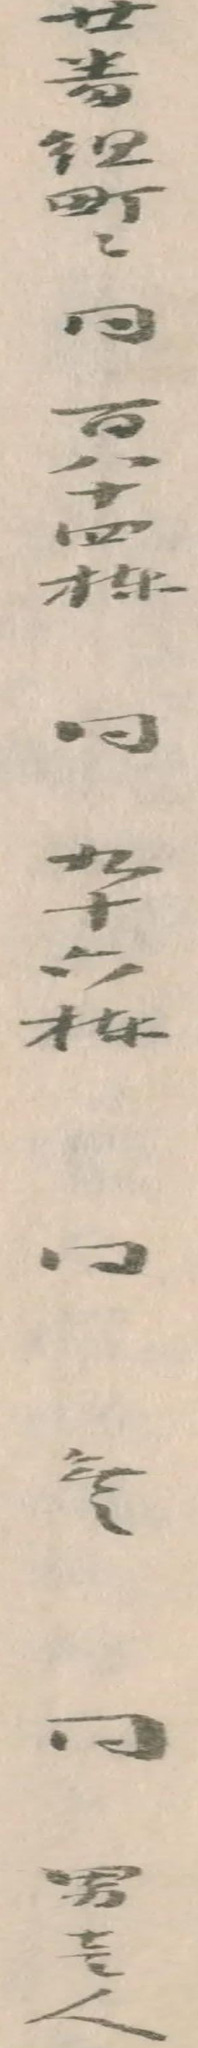廿番組町々同百八十四棟同九十六棟同無之同男壱人
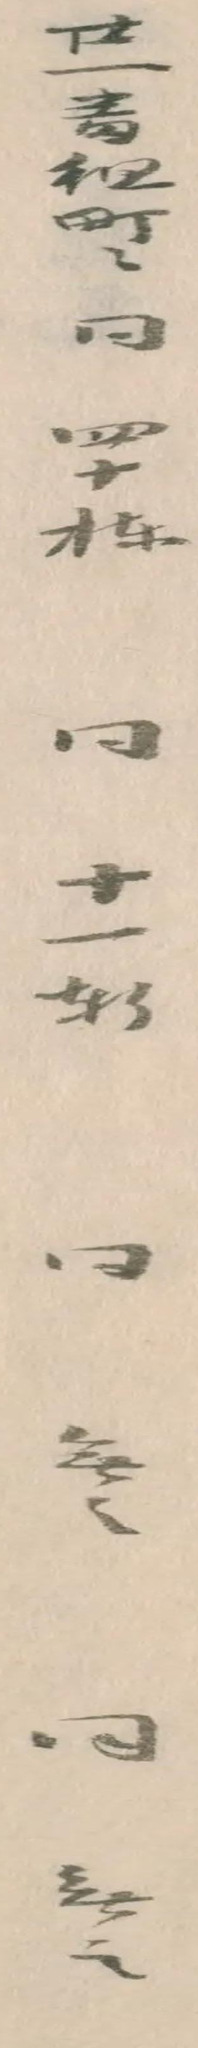廿一番組町々同四十棟同十一軒同無之同無之
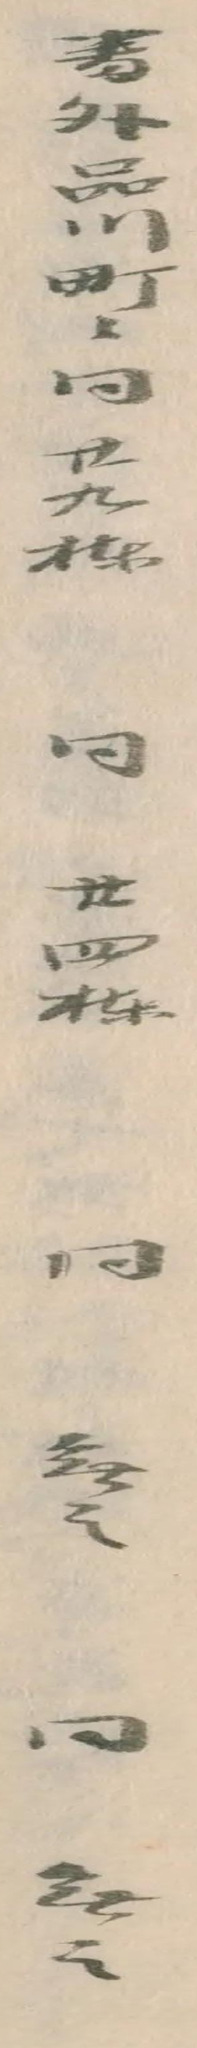番外品川町々同廿九棟同廿四棟同無之同無之

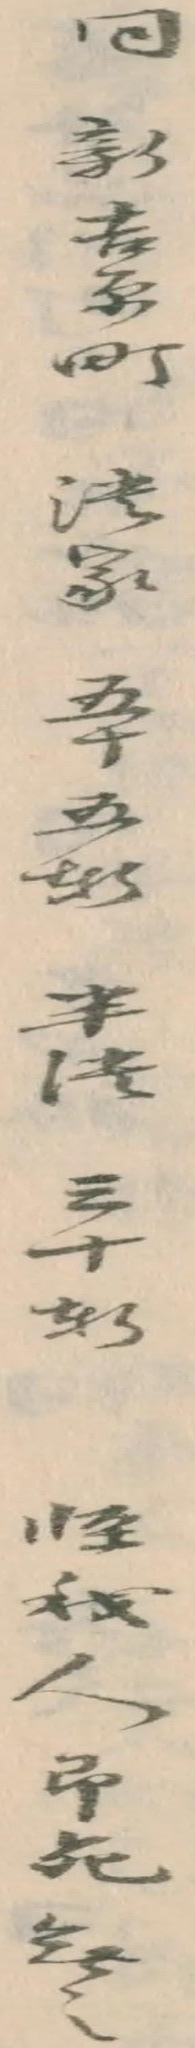同新吉原町潰家五千五軒半潰三十軒怪我人即死無之
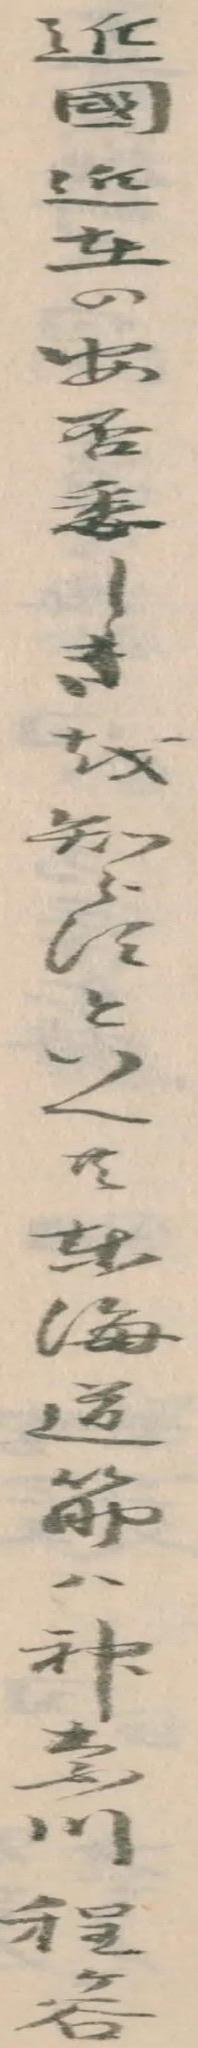近国近在の安否委しきを知らすといへ共東海道筋は神奈川程ヶ谷
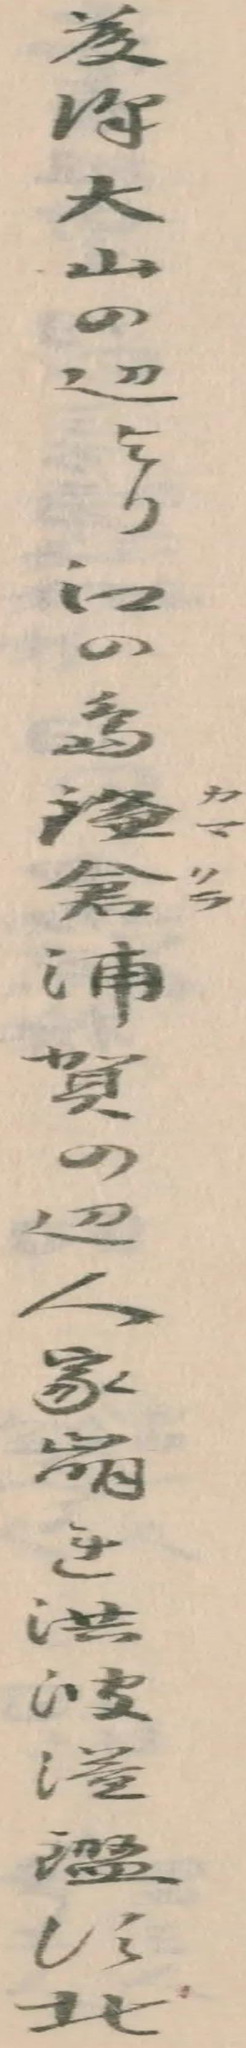藤沢大山の辺より江の島鎌倉浦賀の辺人家崩れ洪波溢鑑す北
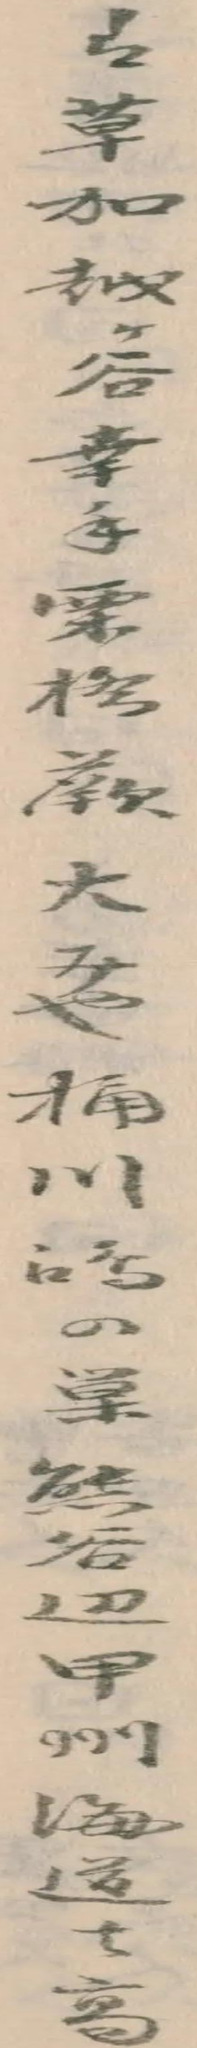は草加越ケ谷幸手栗橋蕨大みや桶川鴻の巣熊谷辺甲州海道は高
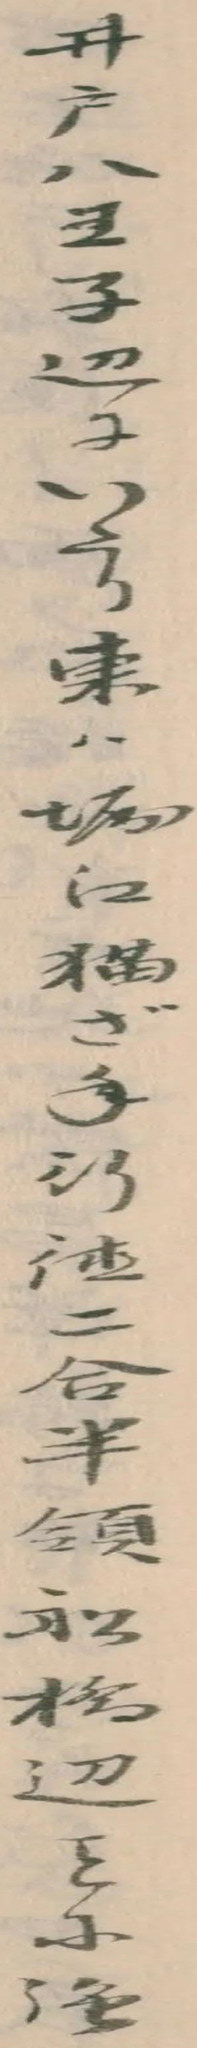井戸八王子辺にいたり東は堀江猫ざね行徳二合半領船橋辺ことに強
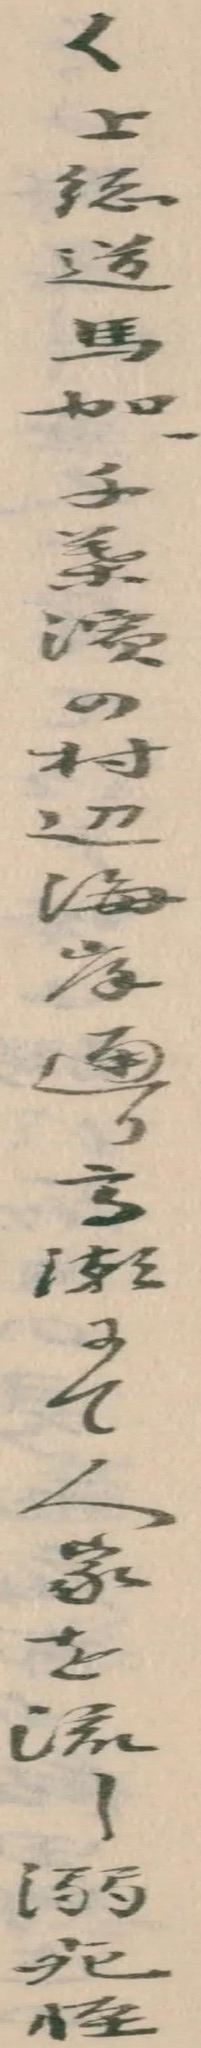く上総道馬加、千葉浜の村辺海岸通り高瀬にて人家を流し溺死怪
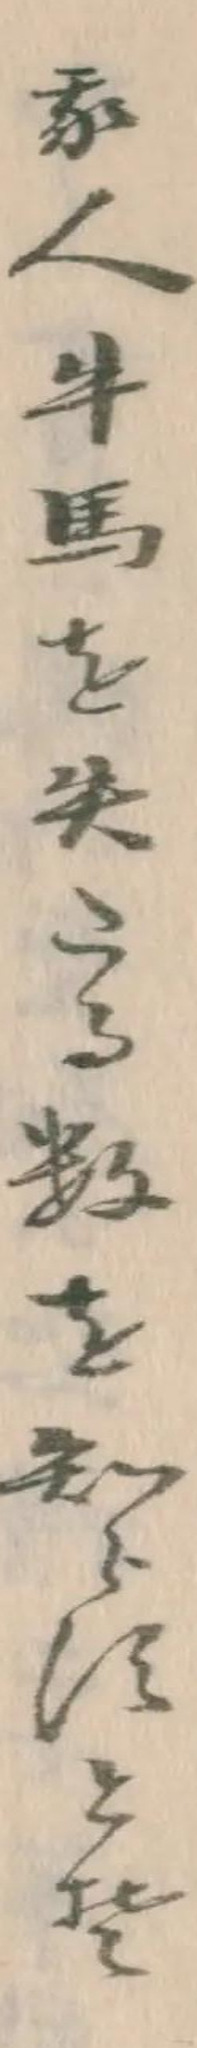我人牛馬を失たる数を知らすとそ
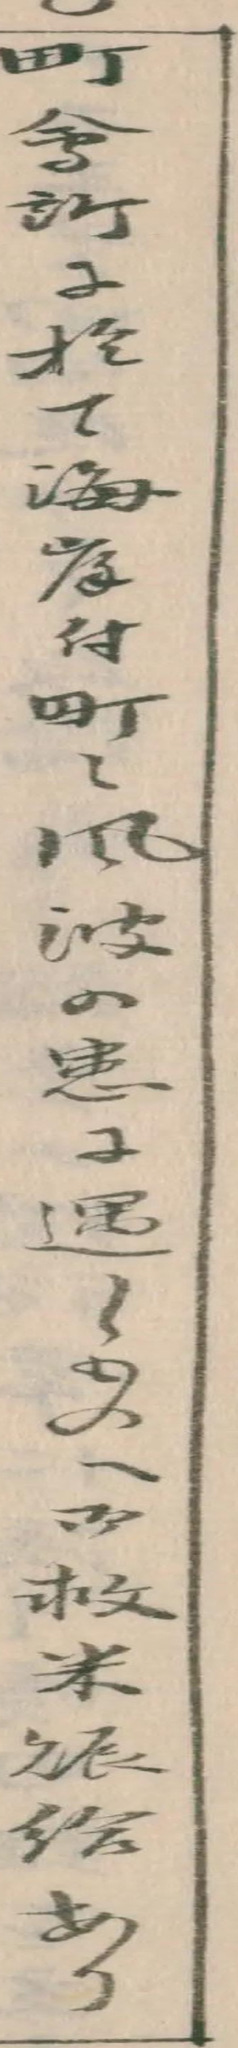〇町会所に於て海岸付町々風波の患に遭しものへ御救米賑給あり
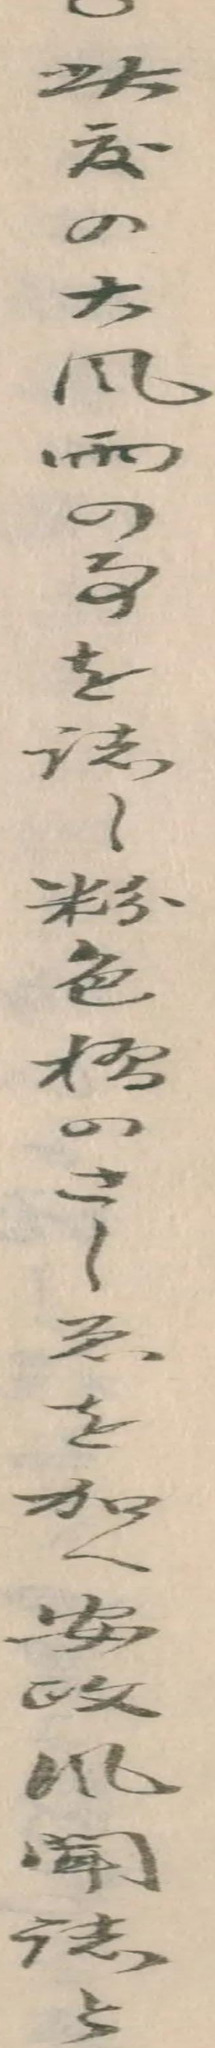〇此度の大風雨の事を誌し粉色摺のさしゑを加へ安政風聞誌と
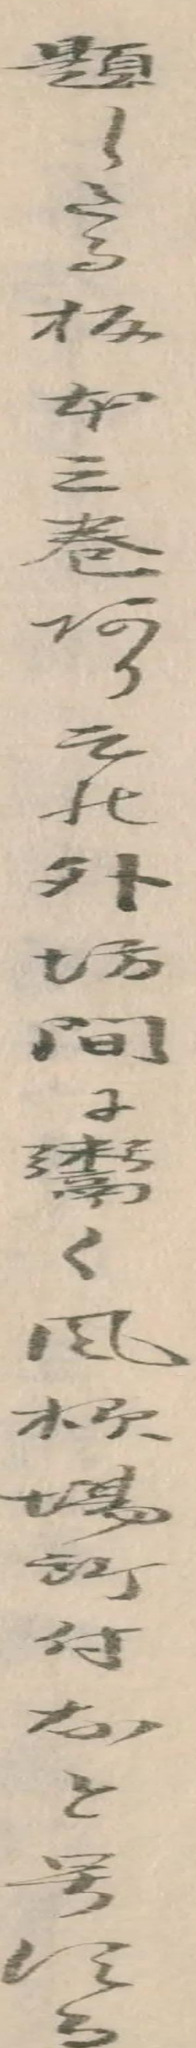題したる板本三巻ありその外坊間に鬻く風様場所付なと号する
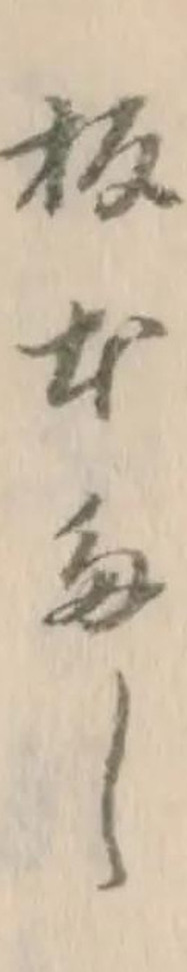板本多し
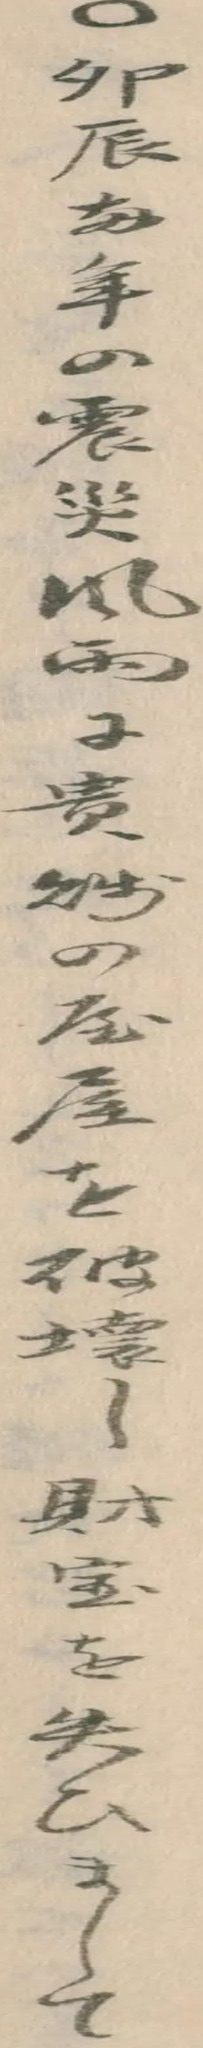〇卯辰両年の震災風雨に貴賤の屋屋を破壊し財宝を失ひまして

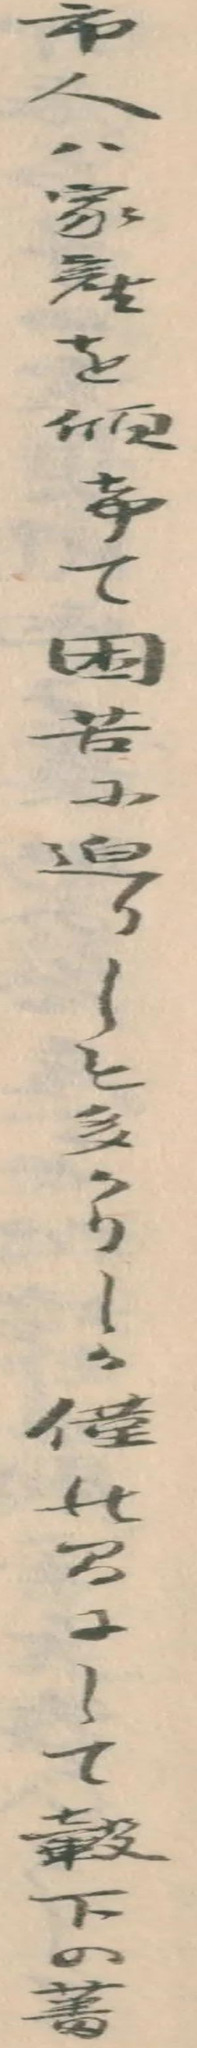市人は家産を傾けて困苦に迫りしこと多かりしか僅の間にして轂下の蕃
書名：地災撮要. 巻10(地震之部) 上,下
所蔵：国立国会図書館 National Diet Library, JAPAN
